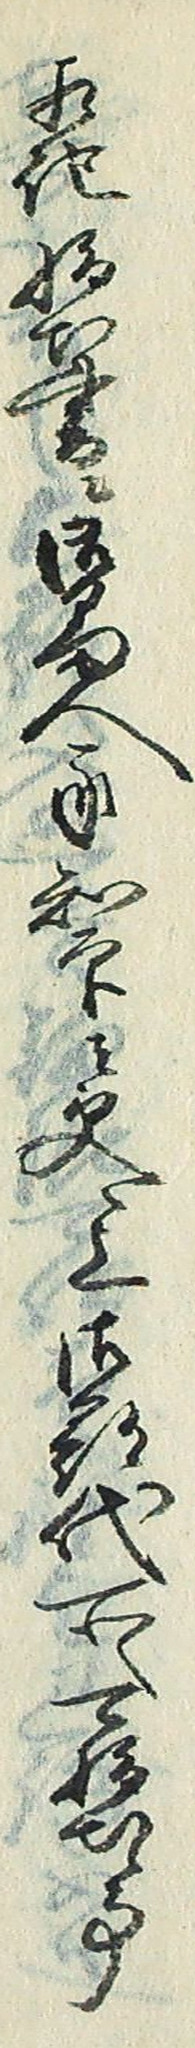相記差出書ニ御番人承知印を受候上御郡代所へ可指出候事
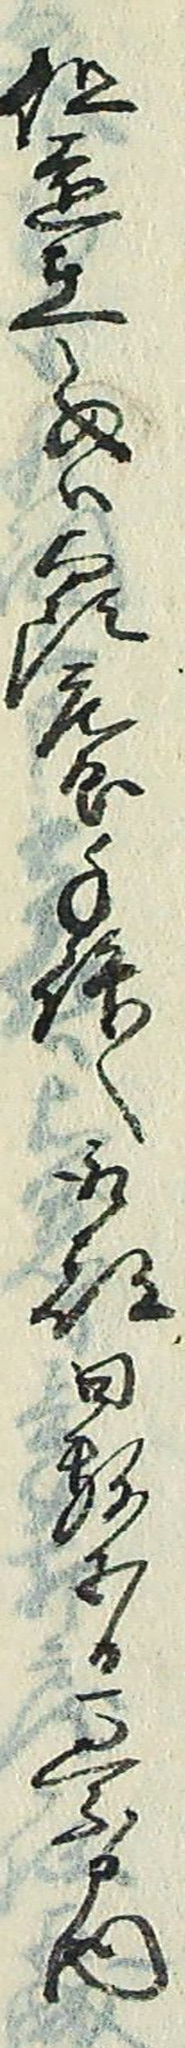但遠在之義ハ与頭庄屋手許へ取都日数五日過不申内
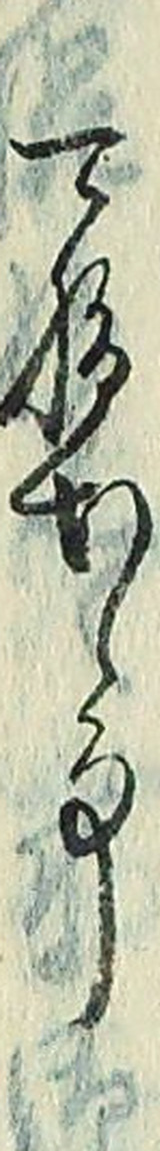可指出候事
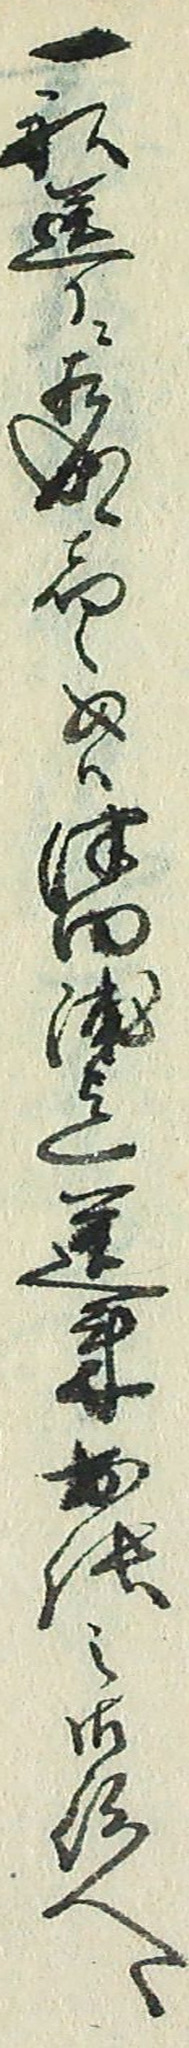一舩送りニ相成候者之義ハ津田浦迄送来出張之御役人へ
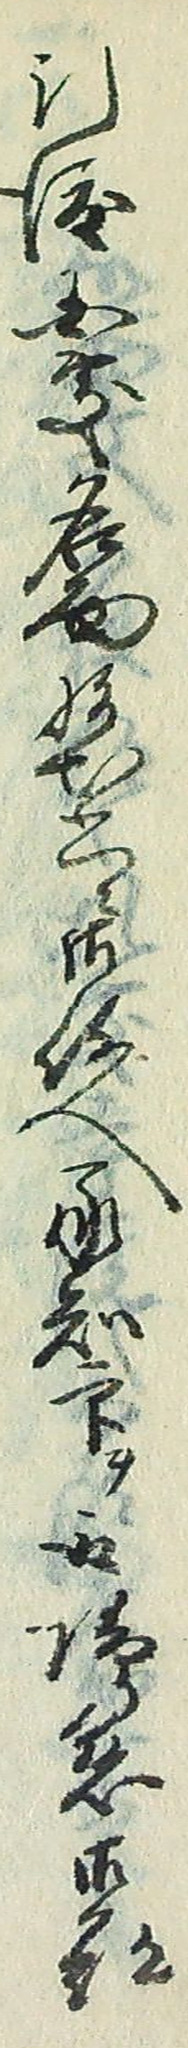引渡国處名面指出書ニ御役人承知印ヲ取帰り懸御郡
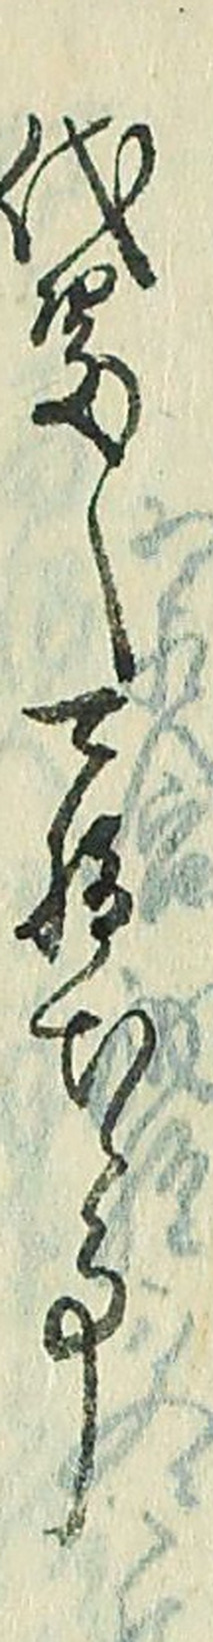代處へ可指出候事
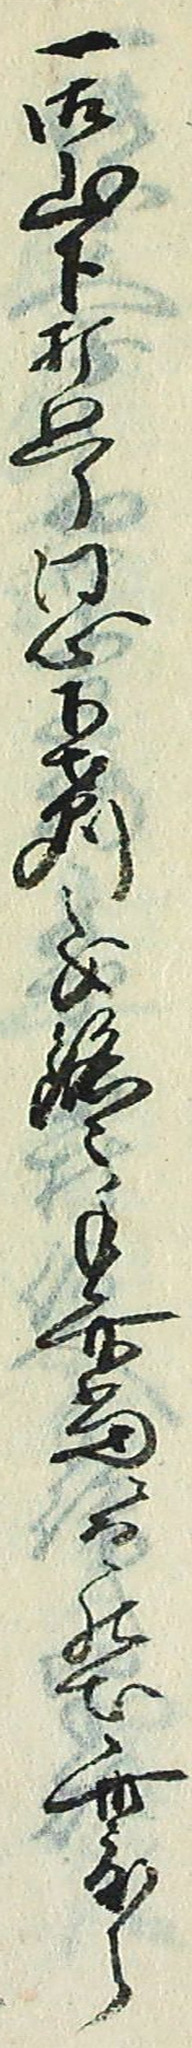一御山下打廻り同心下才判之義銘々手弁當ニ而罷出此度之
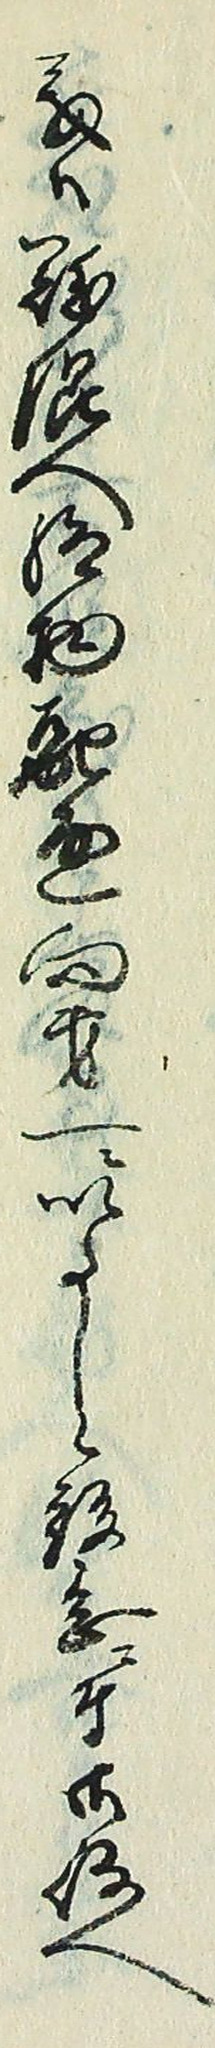義ハ難渋人給物融通向第一ニいたし候趣意ニ付御役人
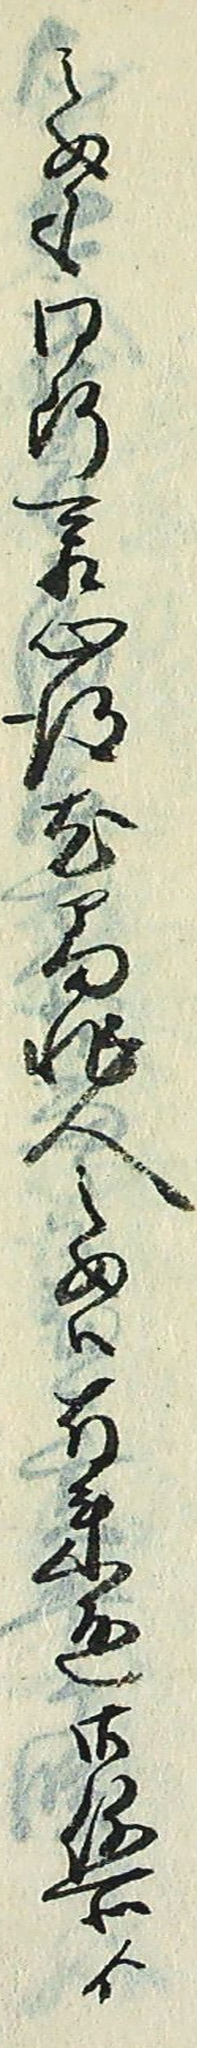之義も同断可相心得尤番非人之義ハ有来通御役所ゟ
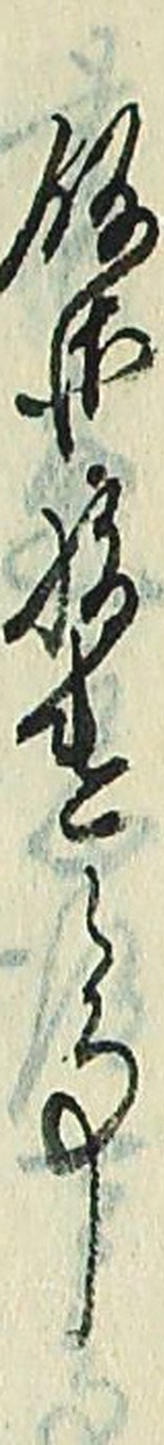飯代指遣候事
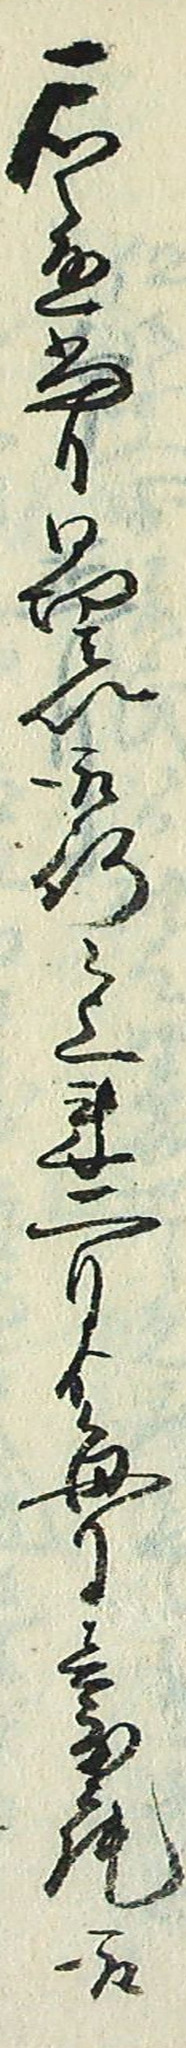一右之通當月日切を以取行之上来二月ゟ毎月壱度宛取
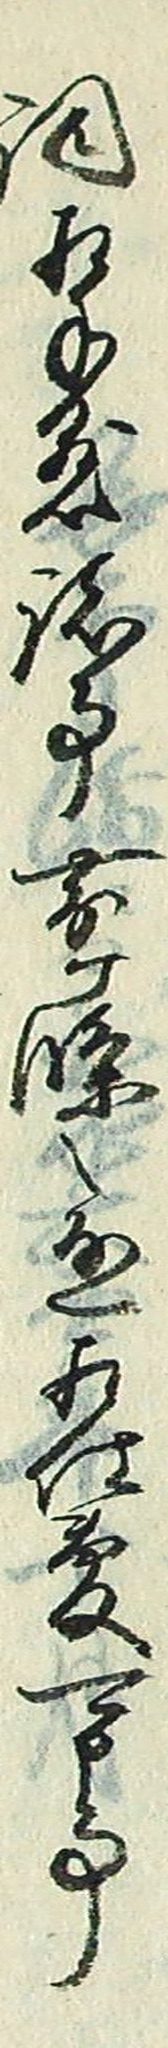調相手懸諸事前ケ條之通相仕管可申事
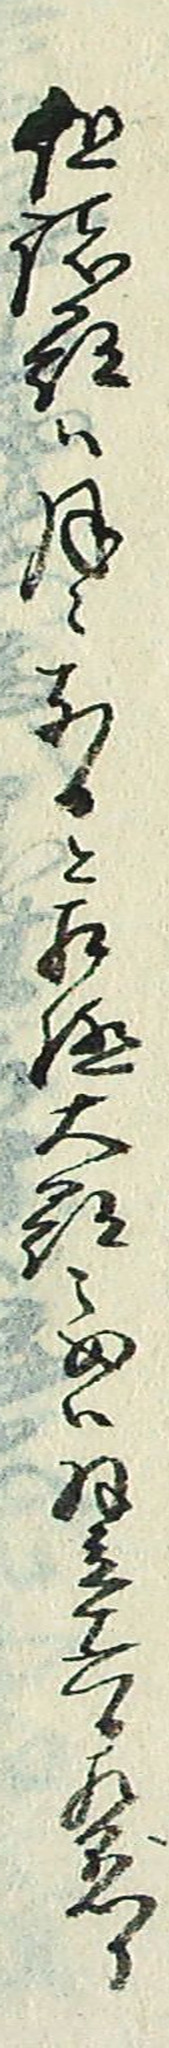但諸郡ハ月々十五日と相極大郡之義ハ翌十六日相懸り
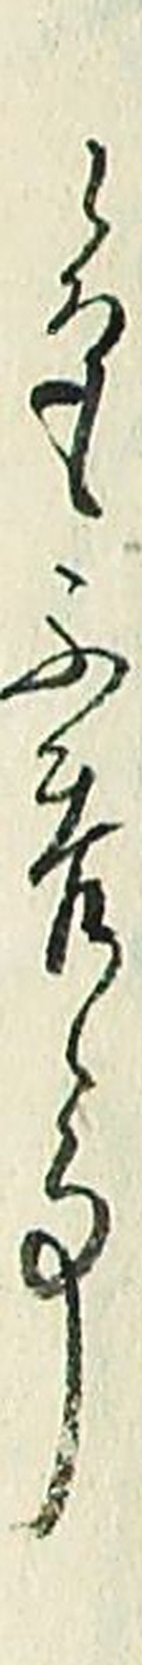候而も不苦候事

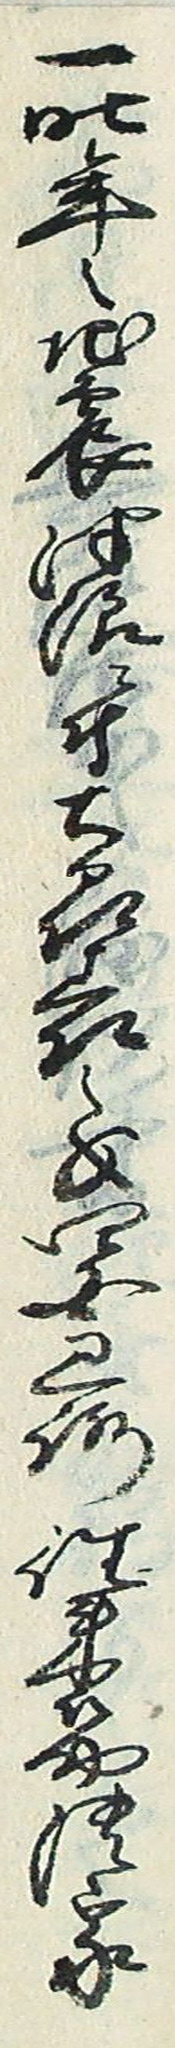一昨年之地震津浪ニ付土州表之義四国辺路往来筋潰家
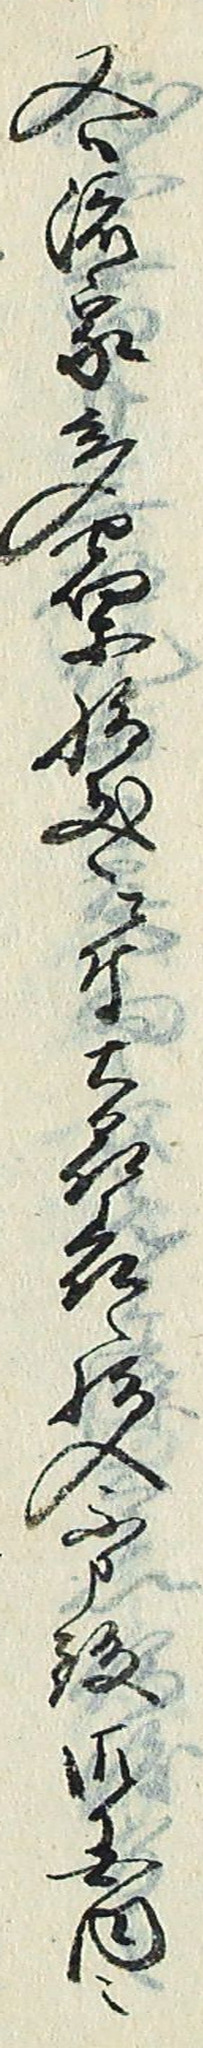又ハ流家多宿等指支ニ付土州表へ指入不申趣御国内之
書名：諸御趣意書并御下知向之写
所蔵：鳴門教育大学 Naruto University of Education
